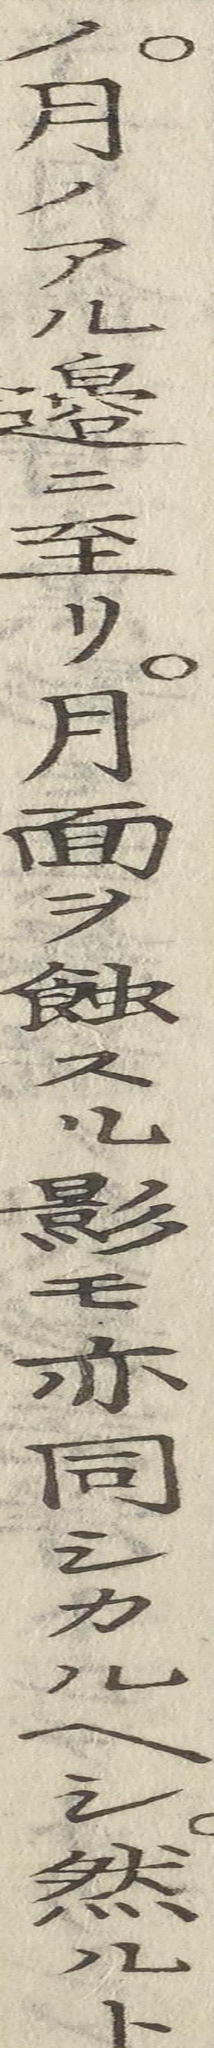ノ。月ノアル辺ニ至リ。月面ヲ蝕スル影モ亦同シカルヘシ。然ルト

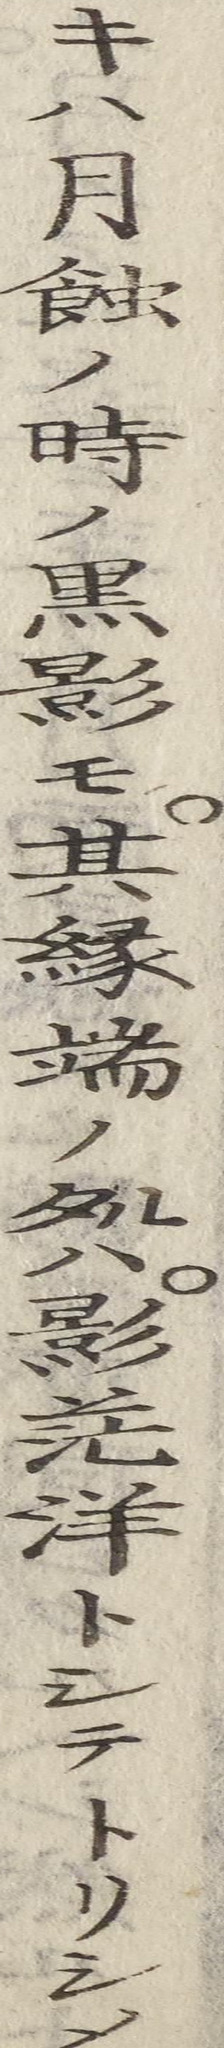キハ月蝕ノ時ノ黒影モ。其縁端ノ処ハ。影茫洋トシテ。トリシメ
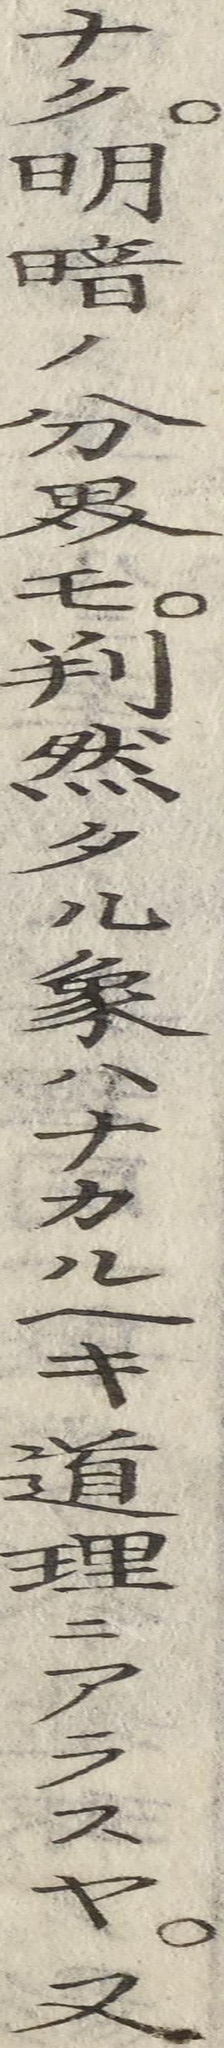ナク。明暗ノ分界モ。判然タル象ハナカルヘキ道理ニアラスヤ。又
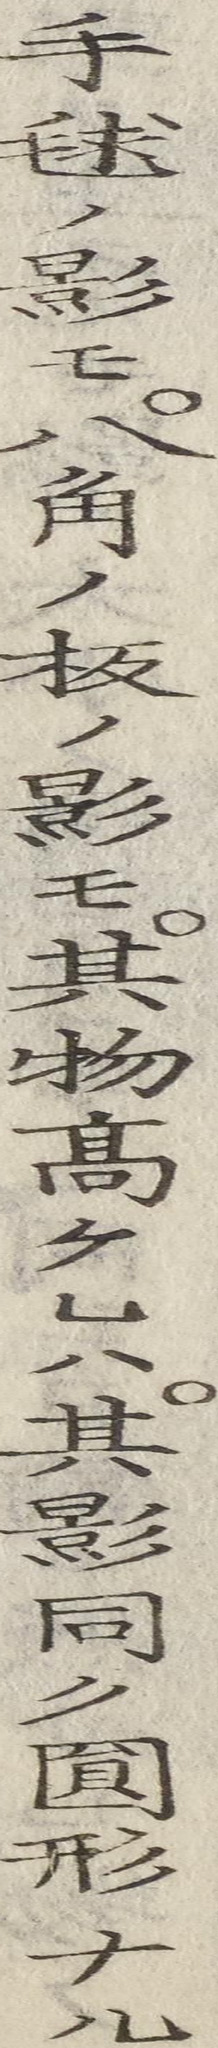手毬ノ影モ。八角ノ板ノ影モ。其物高ケレハ。其影同ク円形ナル
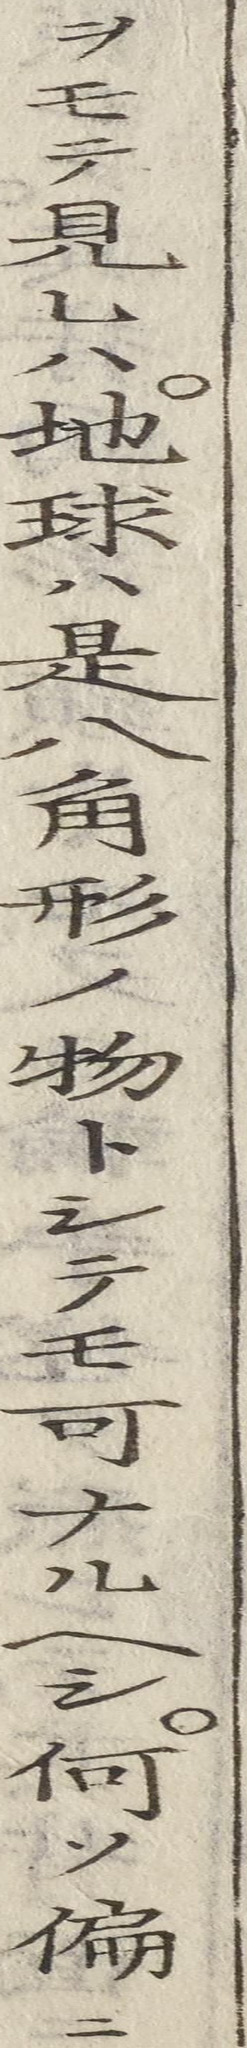ヲモテ見レハ。地球ハ是八角形ノ物トシテモ可ナルヘシ。何ソ偏ニ
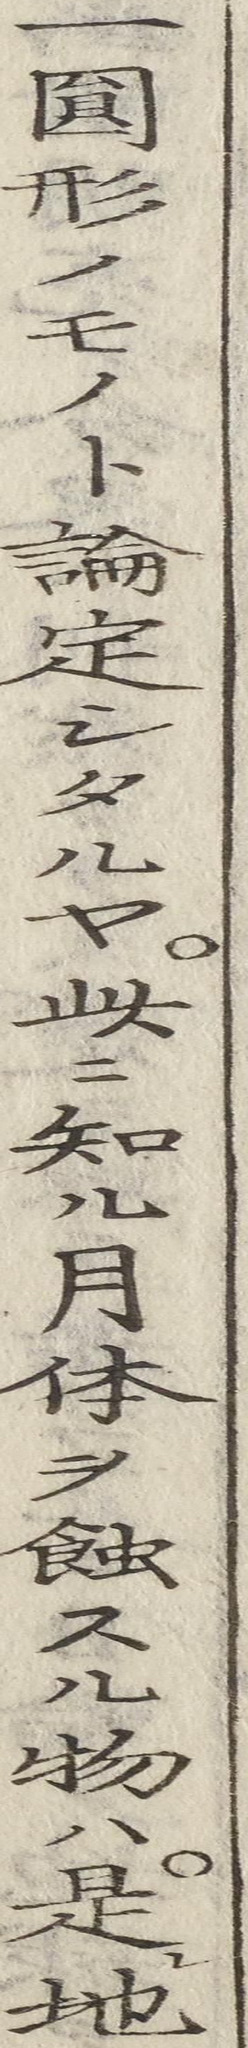一円形ノモノト論定シタルヤ。此ニ知ル月体ヲ蝕スル物ハ。是地
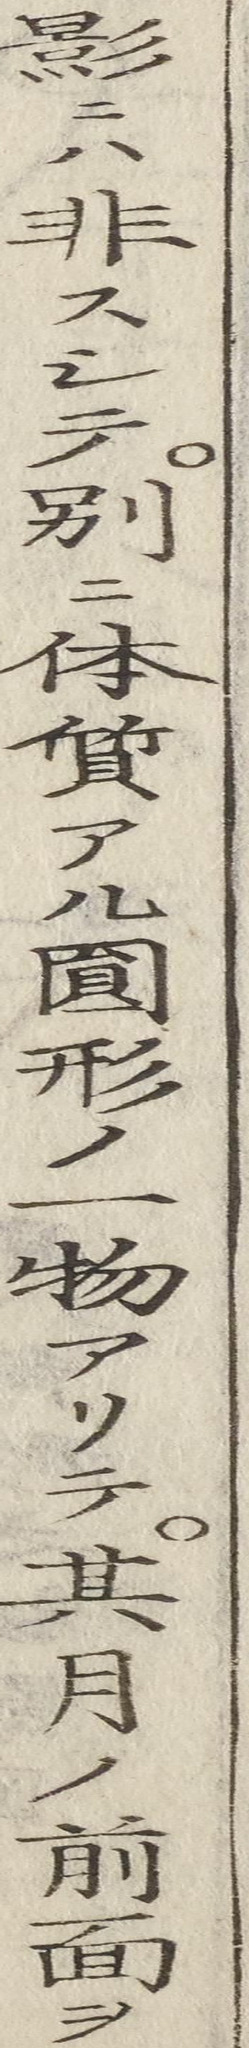影ニハ非スシテ。別ニ体質アル円形ノ一物アリテ。其月ノ前面ヲ
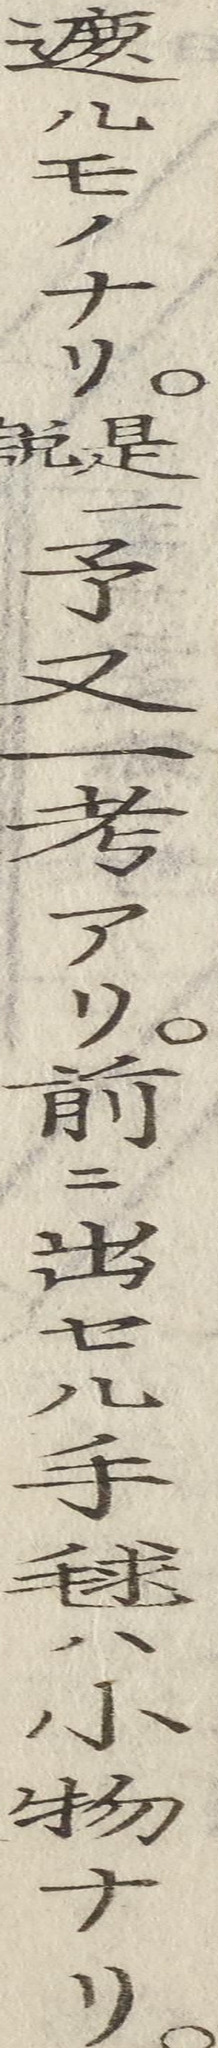遮ルモノナリ。是一説予又一考アリ。前ニ出セル手毬ハ小物ナリ。
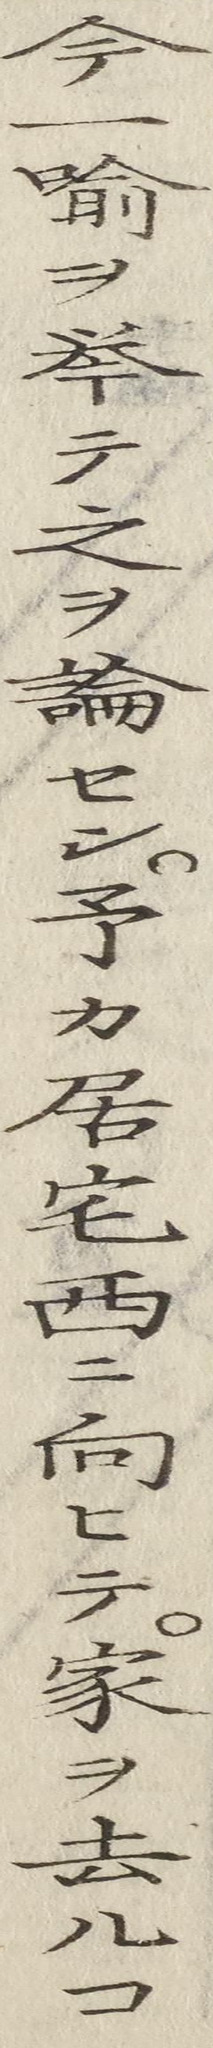今一喩ヲ挙テ之ヲ論セン。予カ居宅西ニ向ヒテ。家ヲ去ルコ
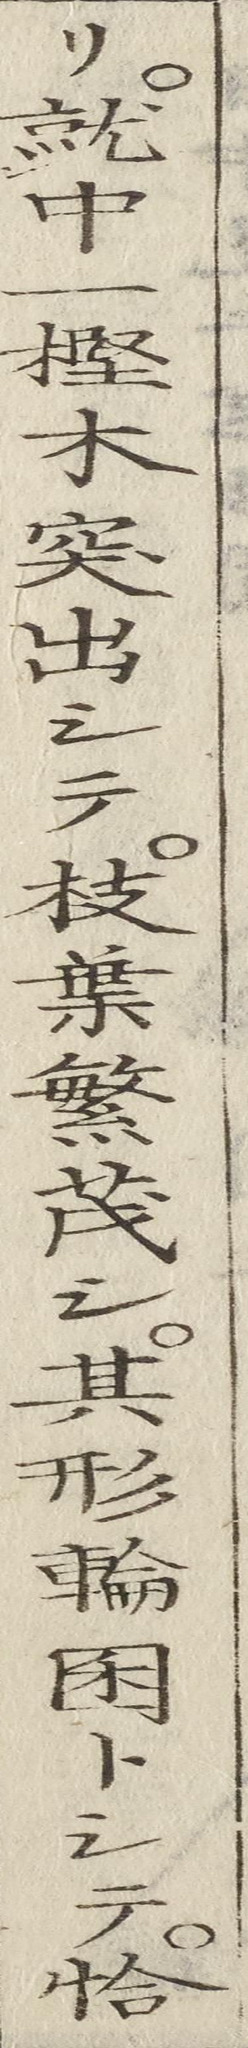リ。就中一樫木突出シテ。枝葉繁茂シ。其形輪囷トシテ。恰
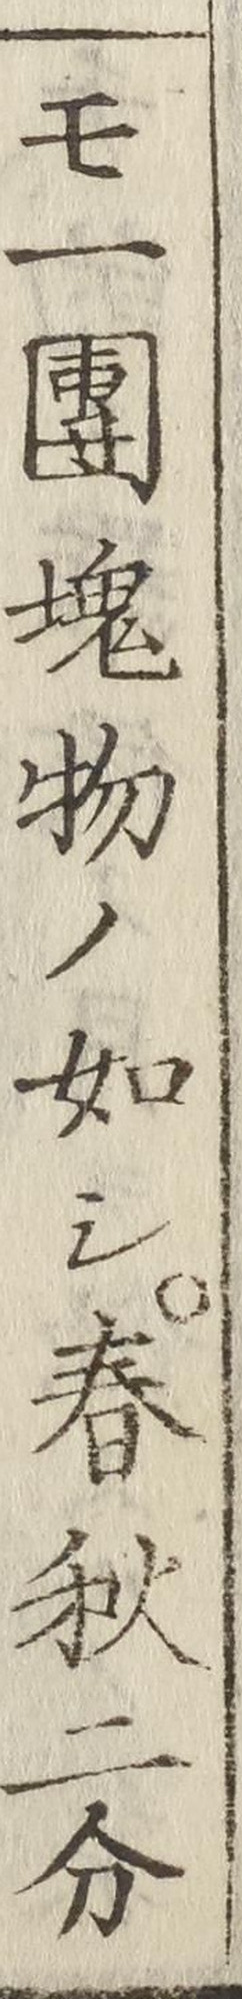モ一団塊物ノ如シ。春秋二分
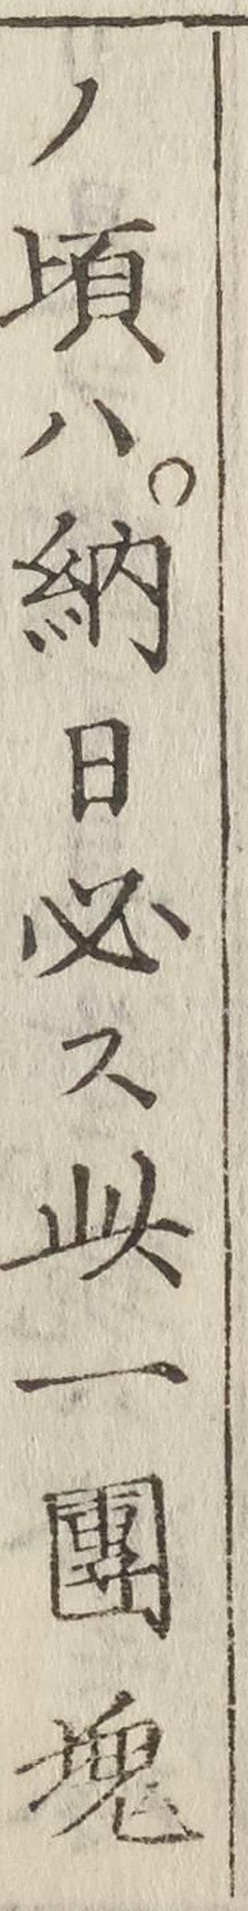ノ頃ハ。納日必ス此一団塊
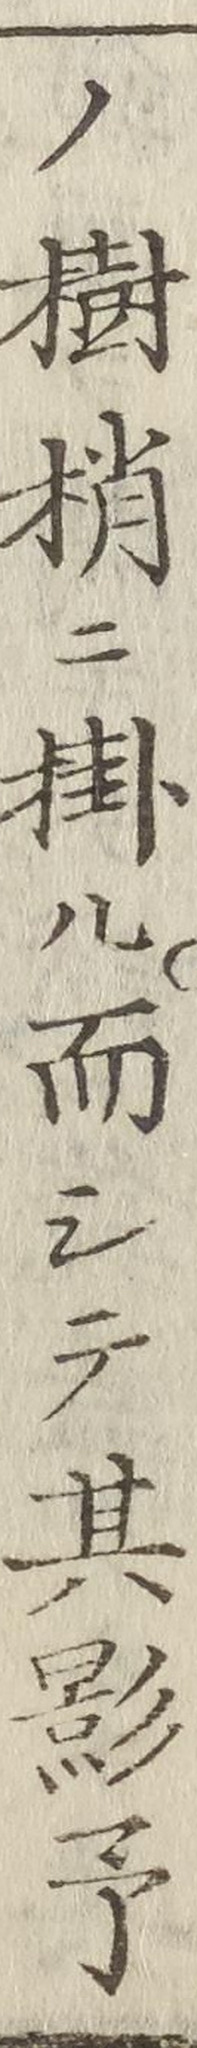ノ樹梢ニ掛ル。而シテ其影予
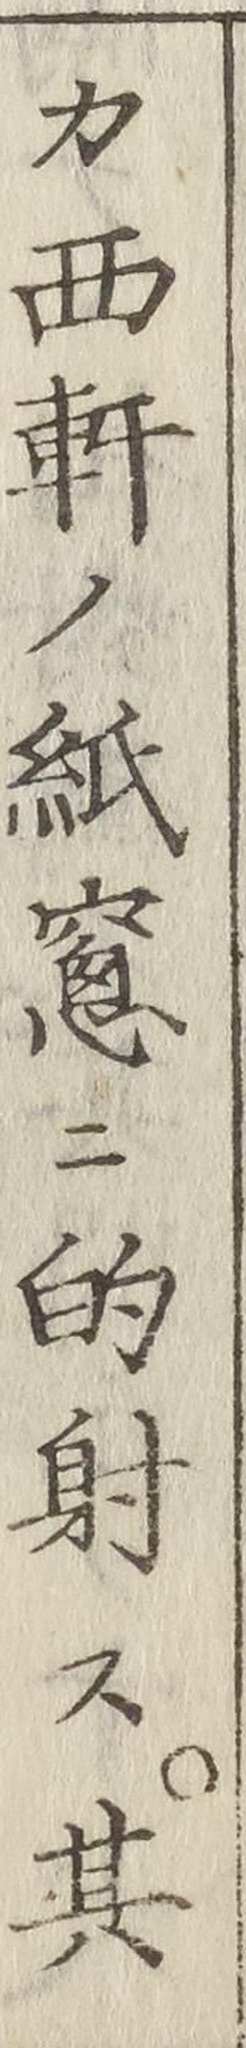カ西軒ノ紙窓ニ的射ス。其
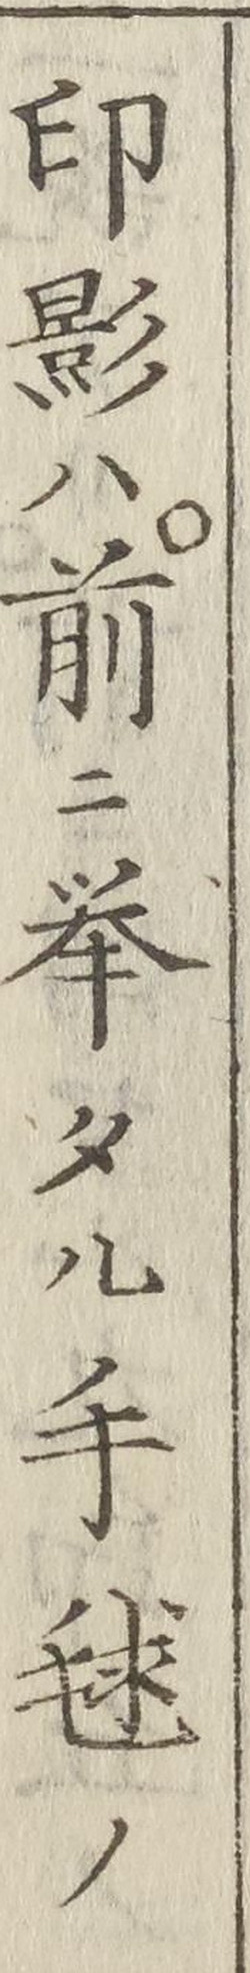印影ハ。前ニ挙タル手毬ノ
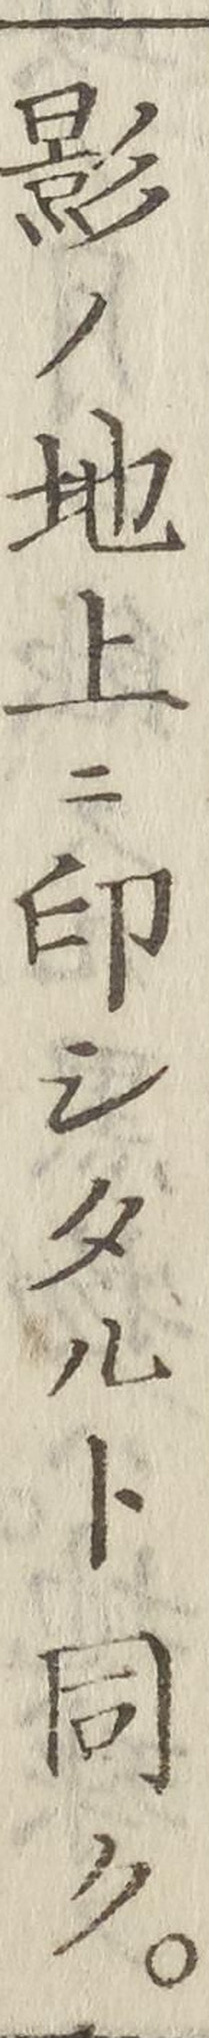影ノ地上ニ印シタルト同ク。
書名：護法新論　中
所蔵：東京大学地震研究所図書室 Earthquake Research Institute Library, The University of Tokyo, JAPAN
